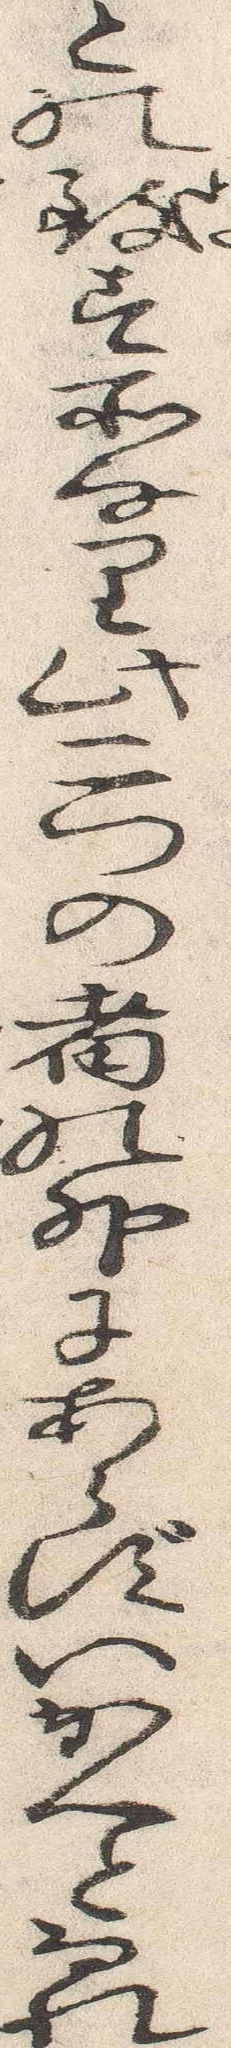との致す所なり此二つの者の外にあらずいかんとなれ
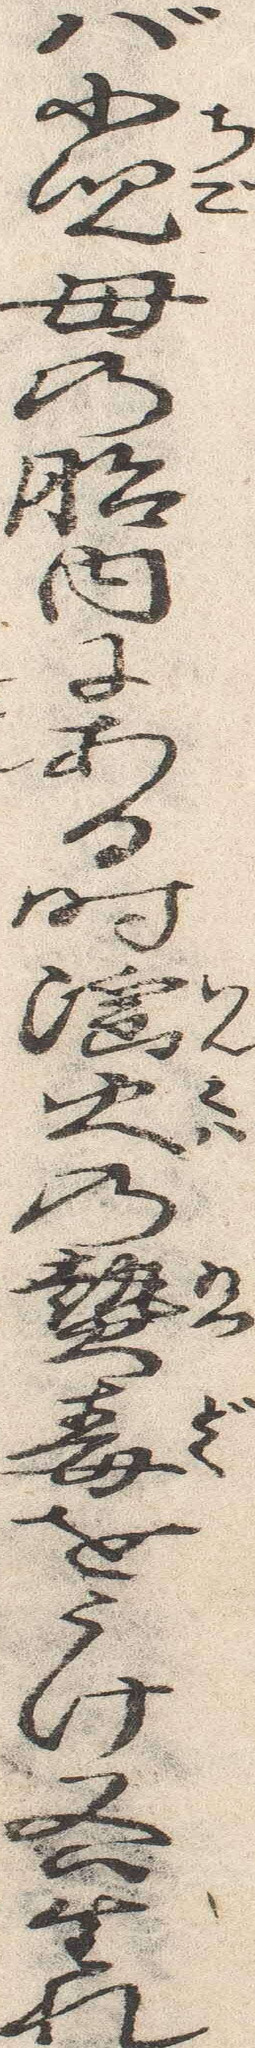ば小児母の胎内にある時淫火の熱毒をうけ又は生れ
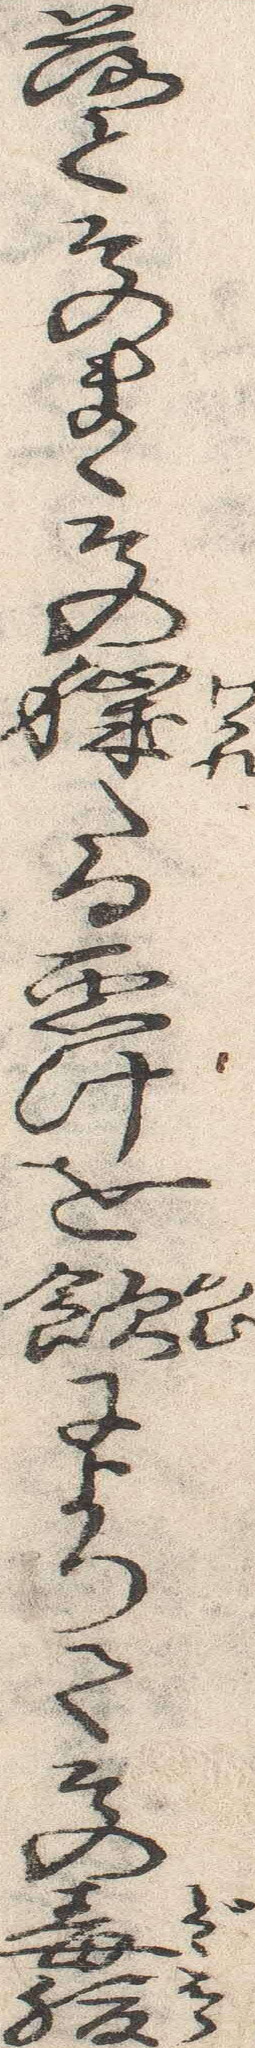落とそのまゝその穢たる悪汁を飲によりてその毒腹
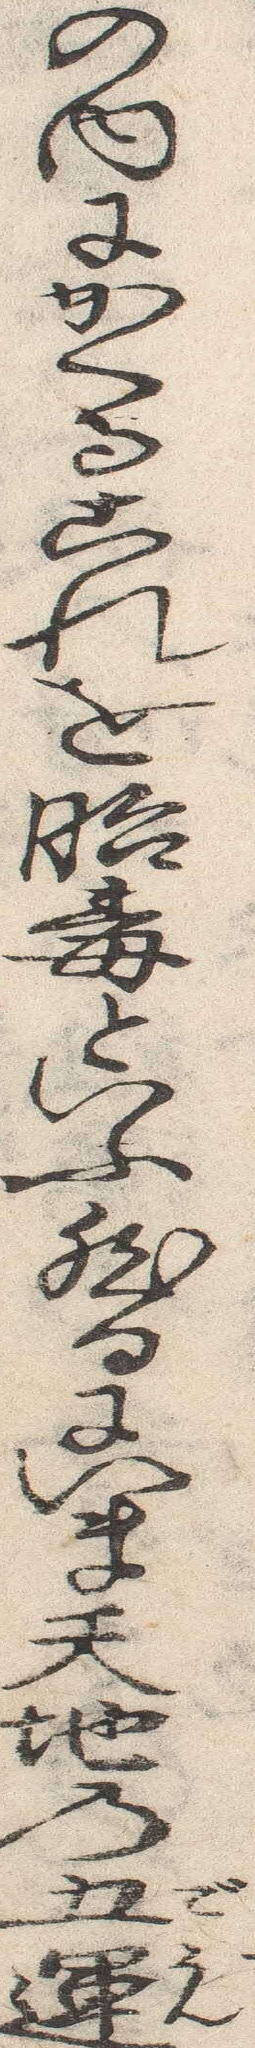の内にかくるこれを胎毒といふ然るにいま天地の五運
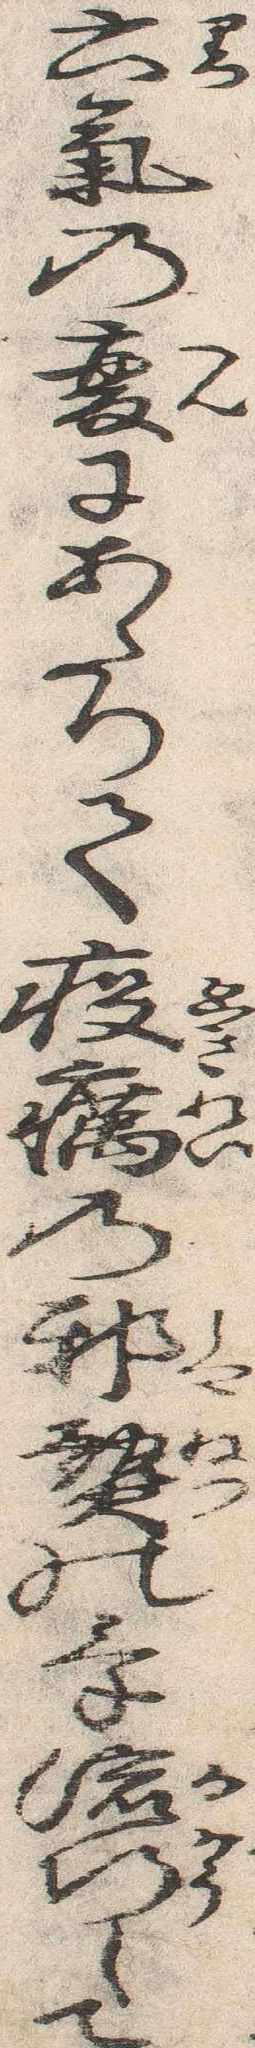六気の変にあたりて疫癘の邪熱の気流行して
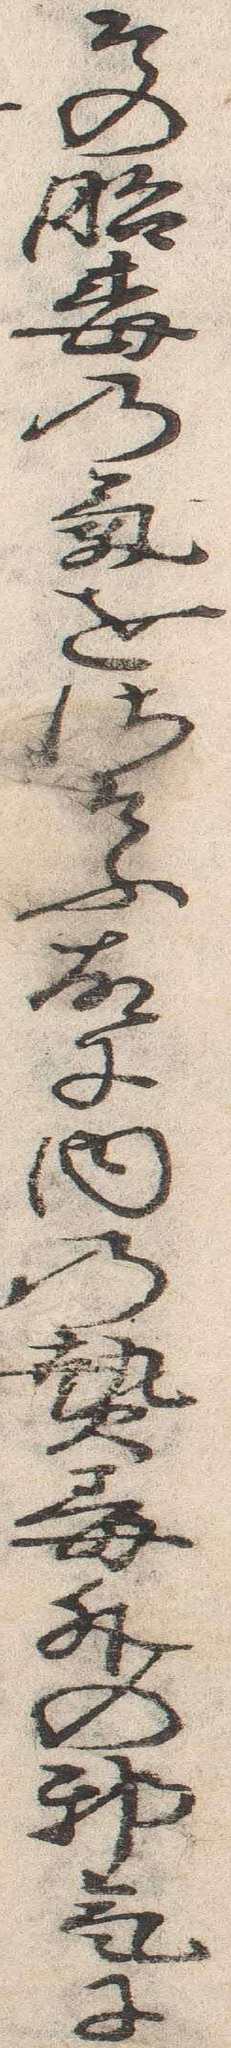その胎毒の気をさそふ故に内の熱毒外の邪気に
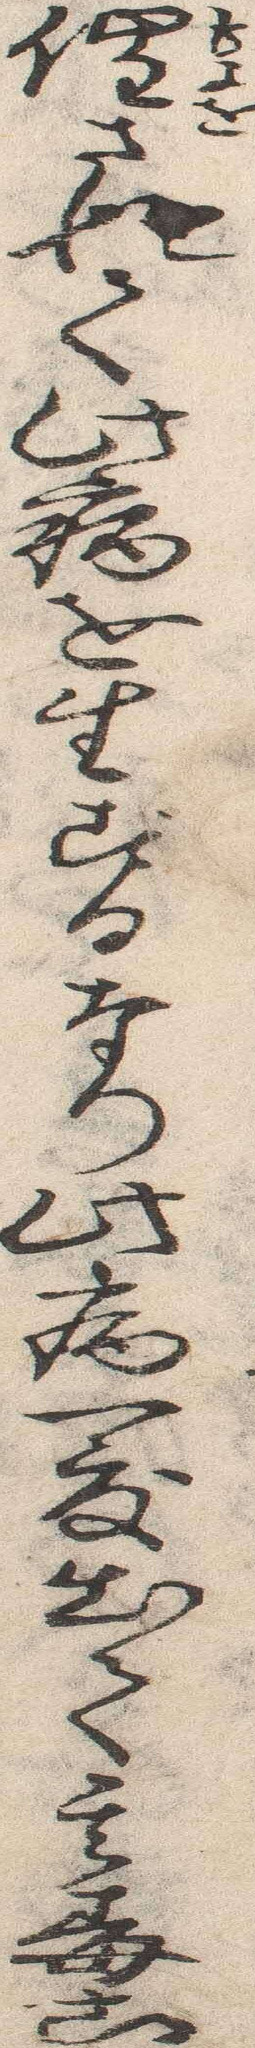催されて此病を生ずるなり此病一度出て其毒こ
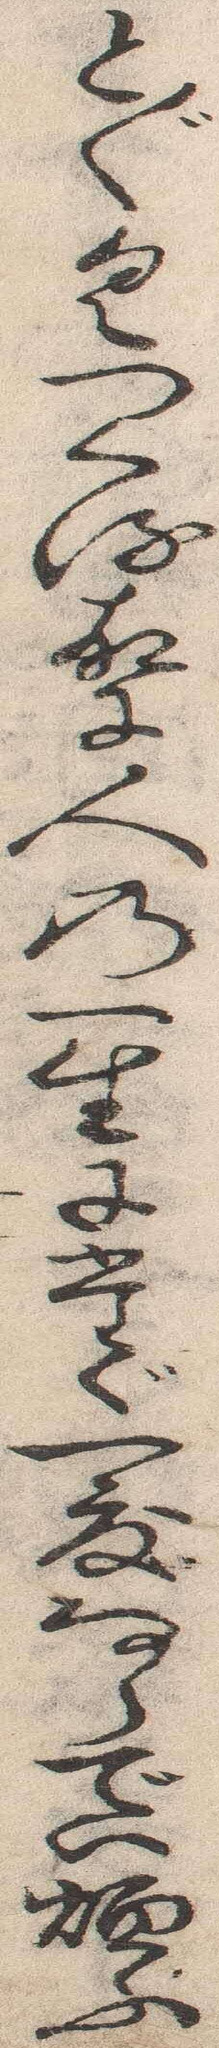と〴〵くつくる故に人の一生にたゞ一度ならでは煩ふ

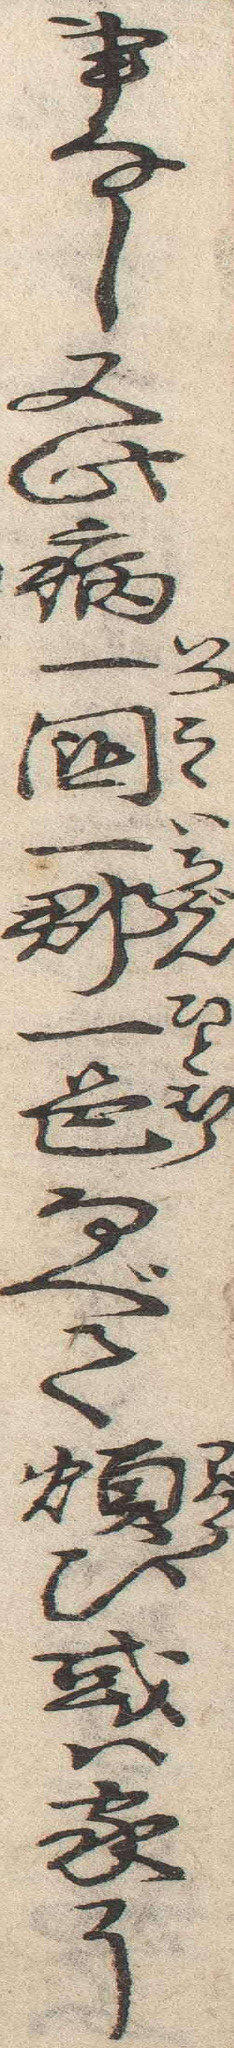事なし又此病一国一郡一邑なべてわず煩ひ或は家に
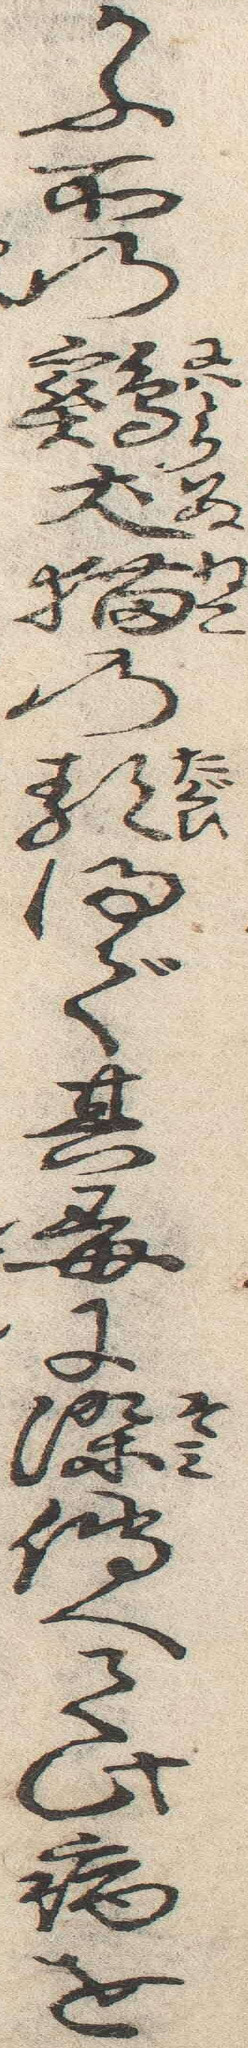かふ所の鶏犬猫の類まで其毒に染伝へて此病を
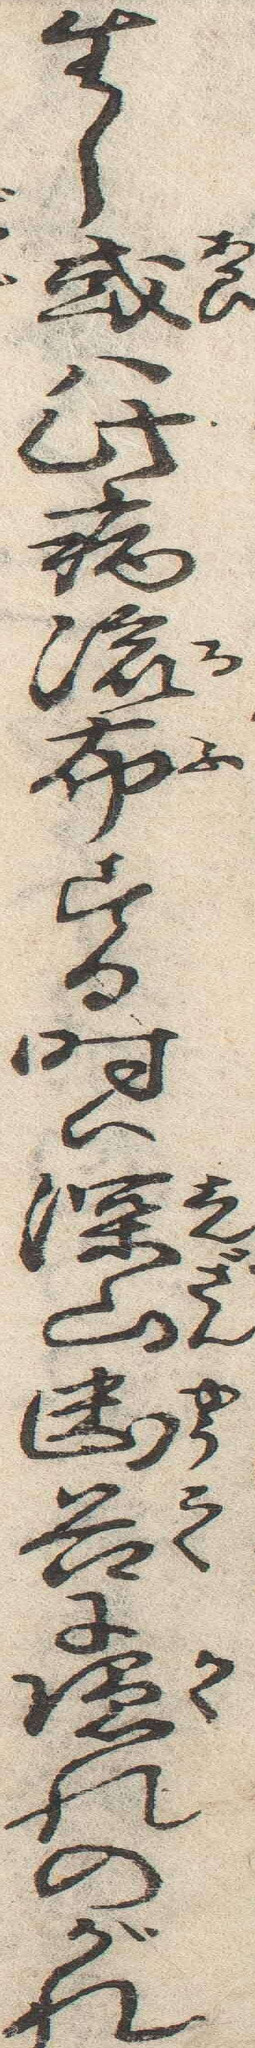生し或は此病流布する時は深山幽谷に隠れのがれ
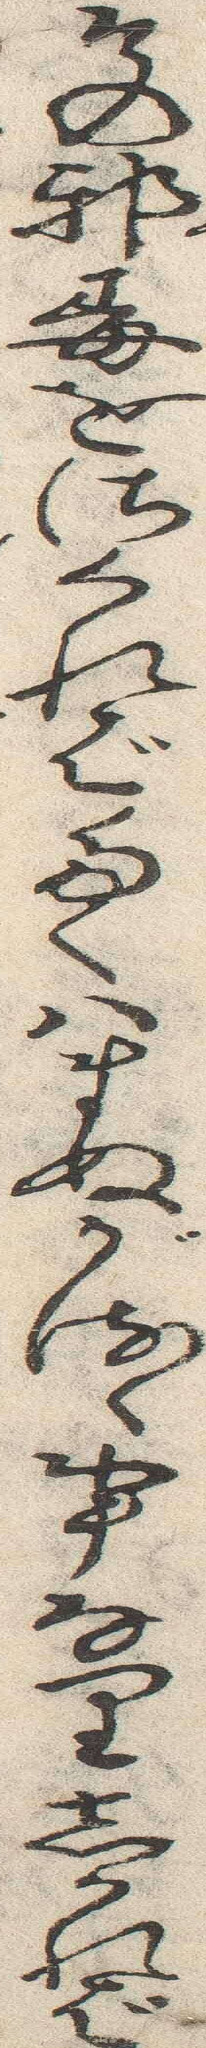その邪毒をさくれば多くはまぬがるゝ事なりしかれば
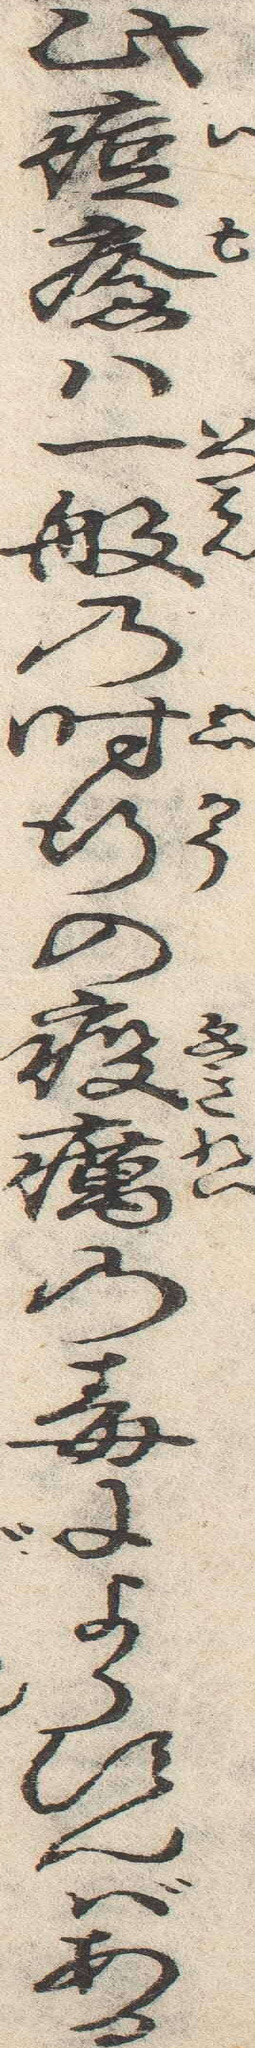此痘瘡は一般の時行の疫癘の毒によらすんばある
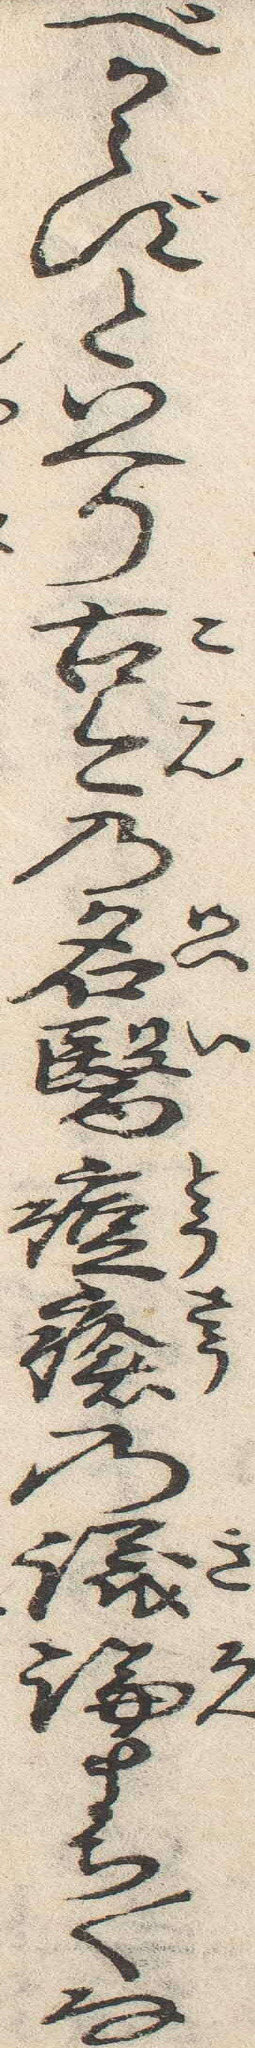べからずといへり古今の名医痘瘡の議論まち〳〵な
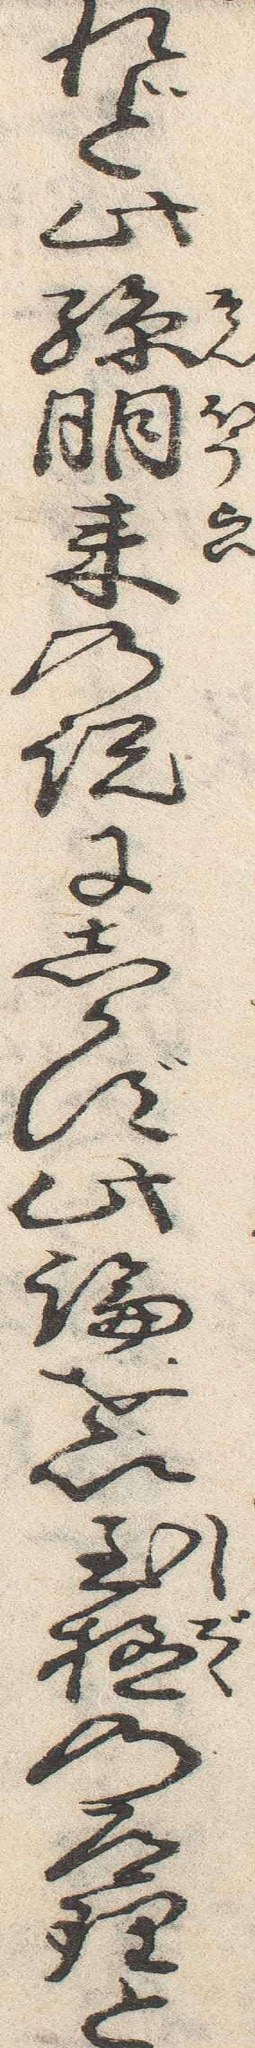れど此孫朋来の説にしかず此論を以至極の道理と
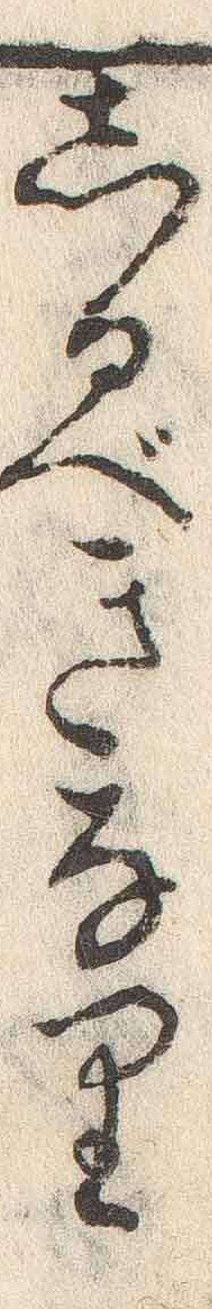しるべきなり
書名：小児必用養育草
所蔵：東京学芸大学附属図書館 国文学研究資料館
